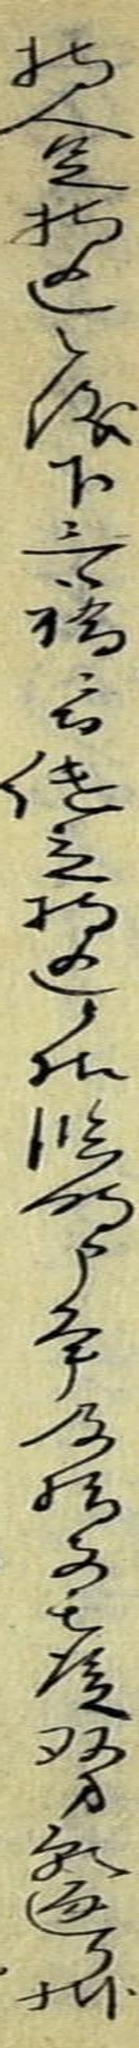持人足持込之儀下三ツ橋ニ而継立持込候様臨時申争及指支其後双方願通り掛
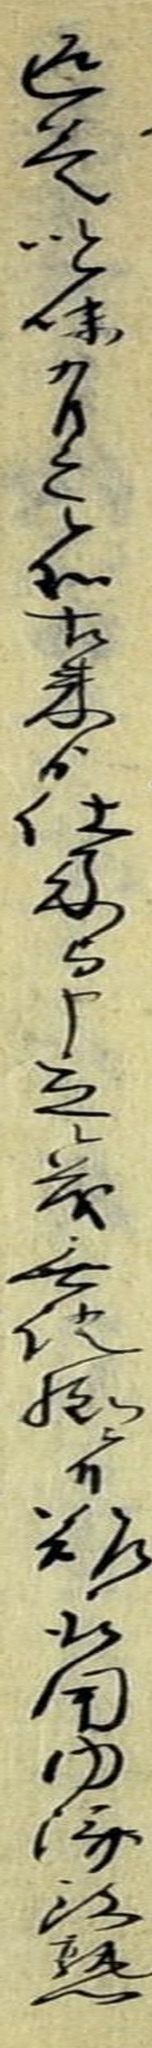返答吟味有之候処古来ゟ仕来与申立候茂無証拠ニ付難取用内済致熟
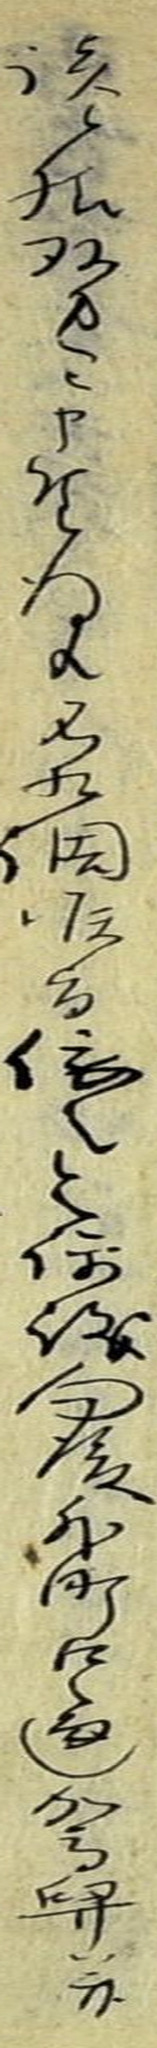談候様双方へ被申付候得共不相調候旨依之令評議向後外町口之通駕舁并
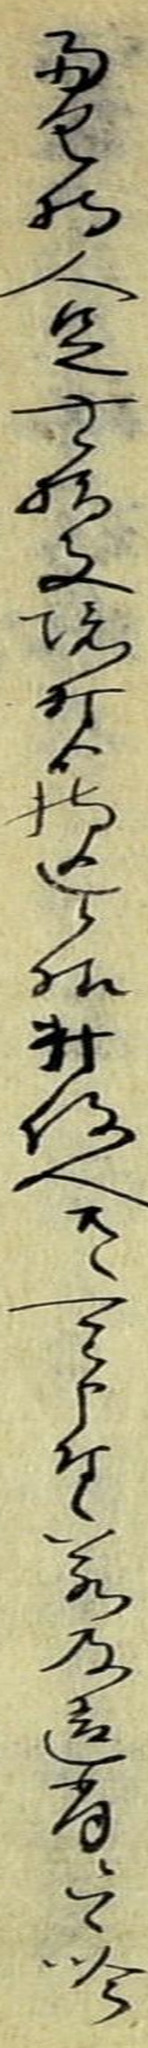雨具持人足無指支境村ゟ持込候様村役人共へ可被申付候若及違背候ハヽ吟
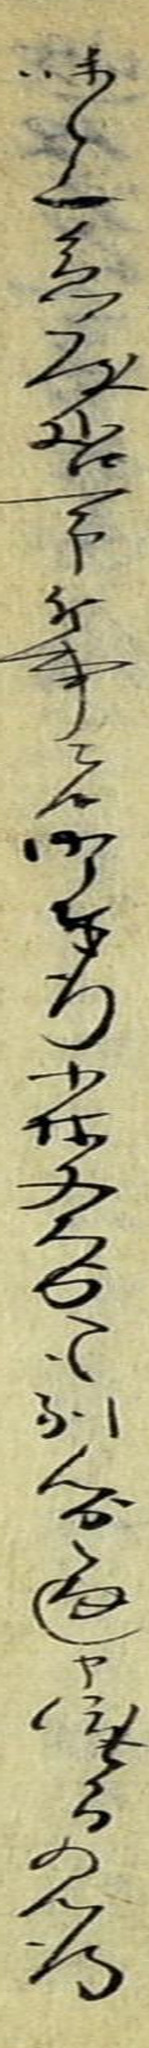味之上急度咎可申付事ニ候町奉行小林又右衛門へも別紙之通申渡候間為心得
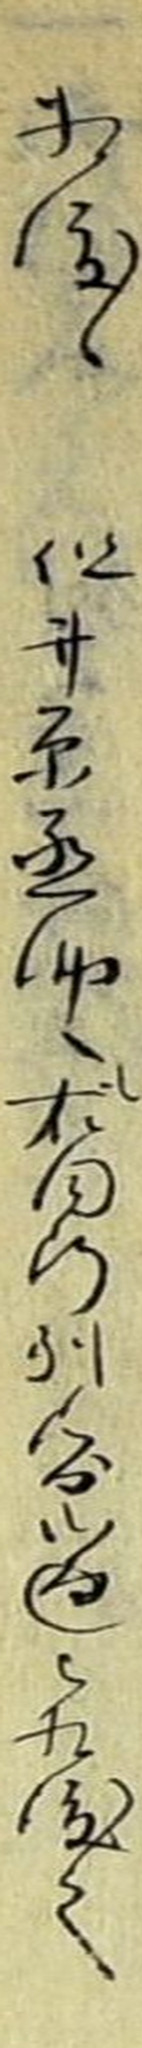相渡候但井原丞助へも右同断別紙弐通被相渡之
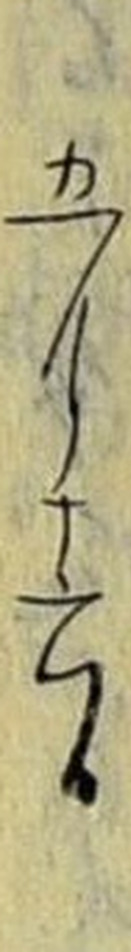五月十六日

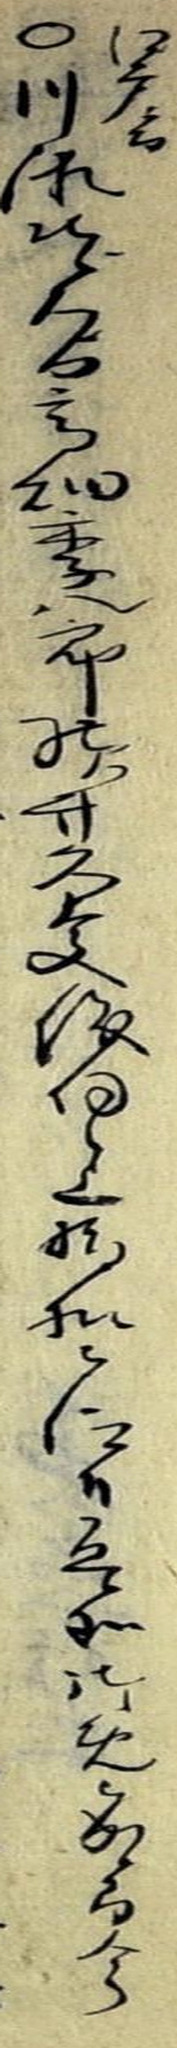〇川瀬次郎右衛門高畑季八郎横井久大夫儀伺之上指控被仰付置候処御免被成候間今
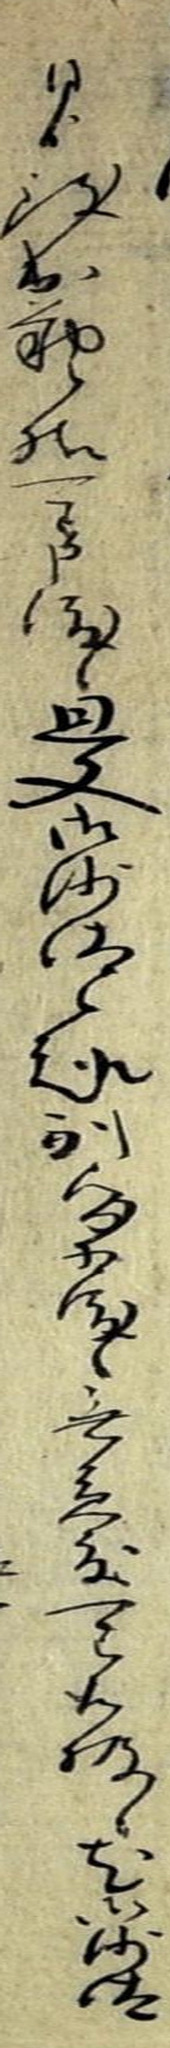日ゟ致出勤候様可被申渡候且又御沙汰之趣別紙相渡候無急度可被取扱候尤御沙汰
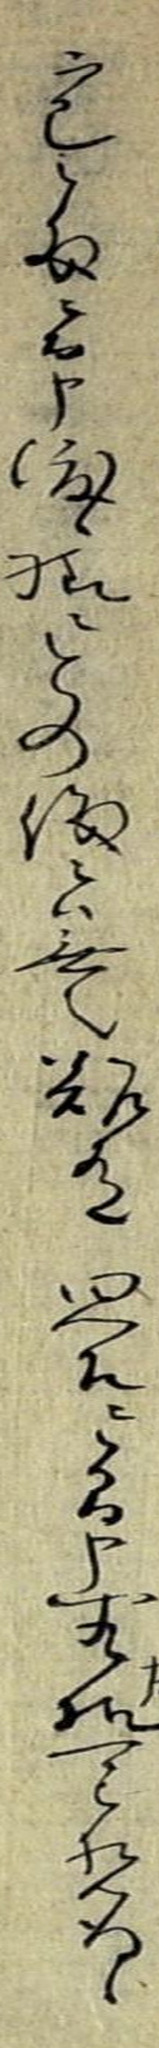而已之義ニ而申渡候様ニとの儀ニハ無之難有思召ニ候間申聞候左様可被相心得候
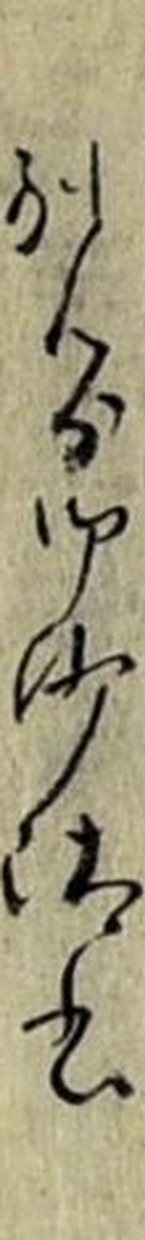別紙御沙汰書
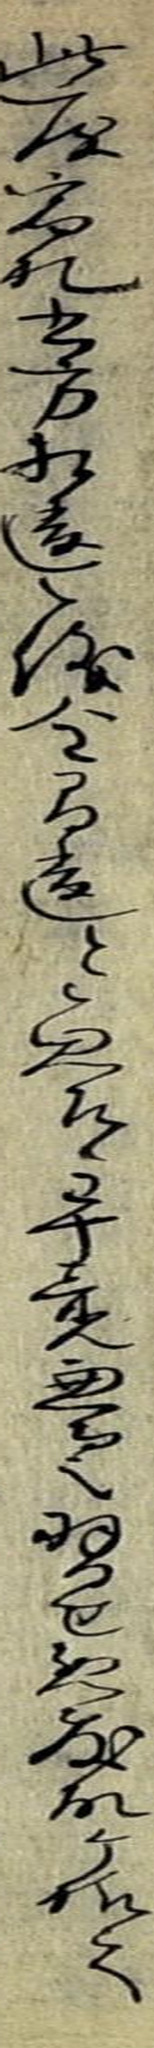此度宿札書方相違之儀全間違と被思召候畢竟兼而之習せ悪敷故ケ様之
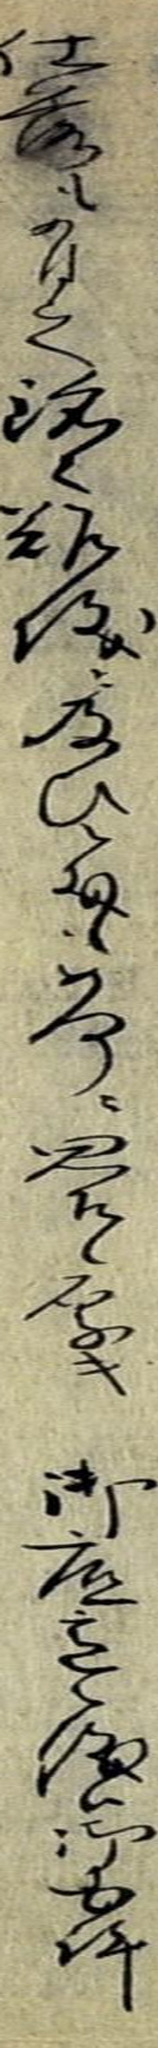仕落も有之銘々難儀ニ及ひ候義も如何ニ思召候厚キ御底意之儀ハ御国許
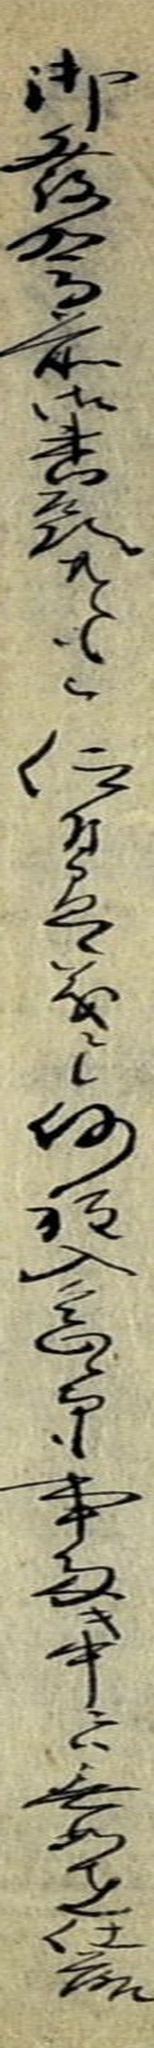御発駕前御番頭共へも被仰付置候義ニ候何程入念ニ而も事多キ中ニハ無如在仕落
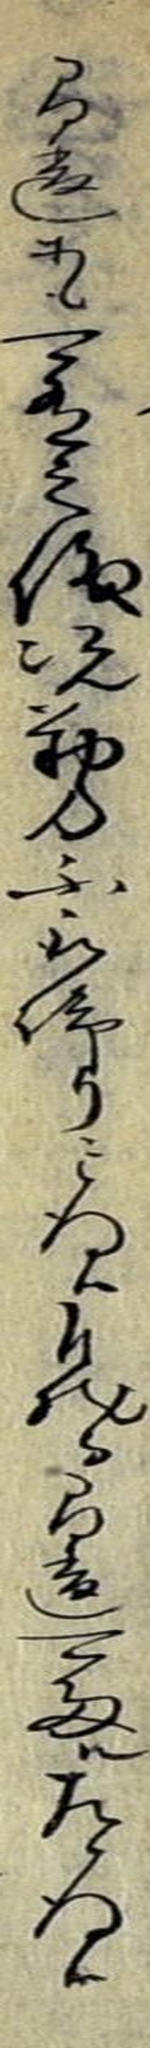間違等も可有之儀況勤方不取締りニ候得ハ自然与間違可多ル左候得ハ
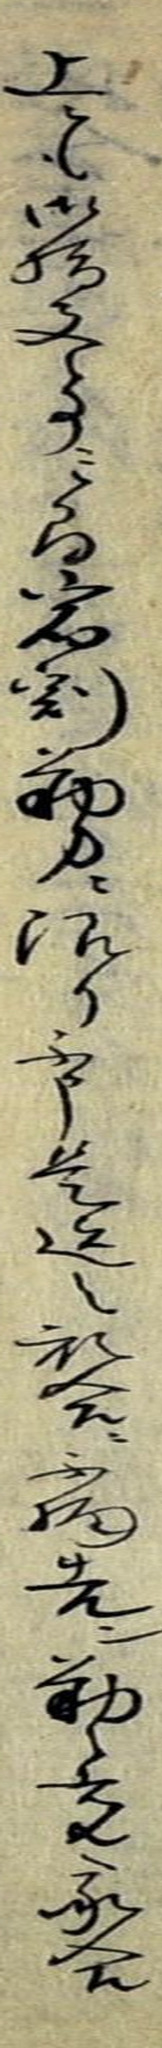上ニも御指支候事ニ候間宿割勤方ニ限り不申是迄之形合ニ不拘先ン勤之者共へ承合
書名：命令之部 三
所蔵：福井県文書館 Fukui Prefectural Archives
